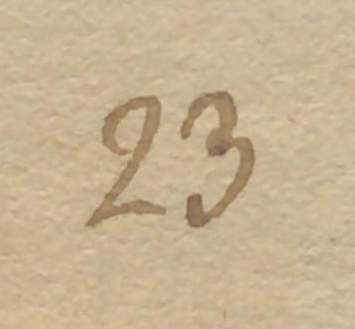23
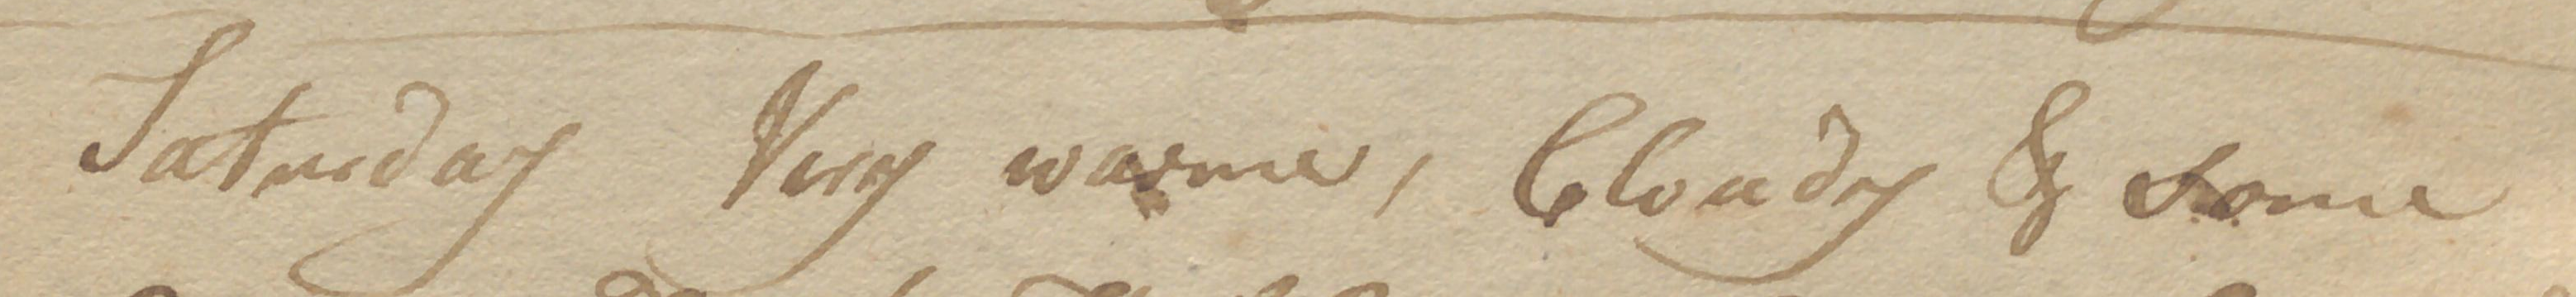Saturday Very warme, Cloudy & some
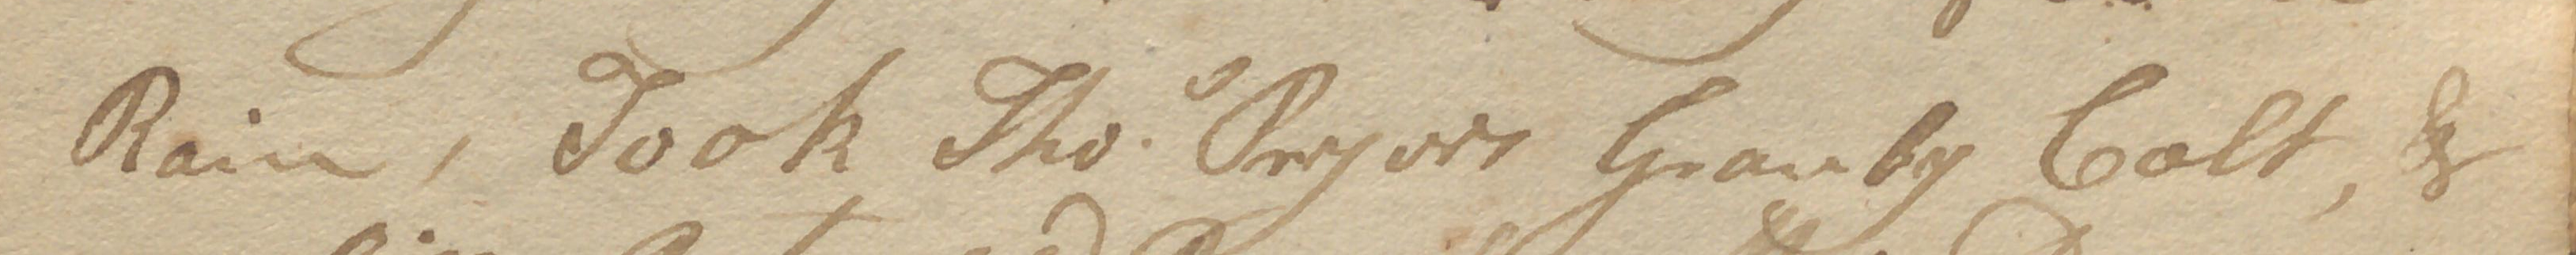Rain, Took Tho^s. Pryors Grauby Colt &
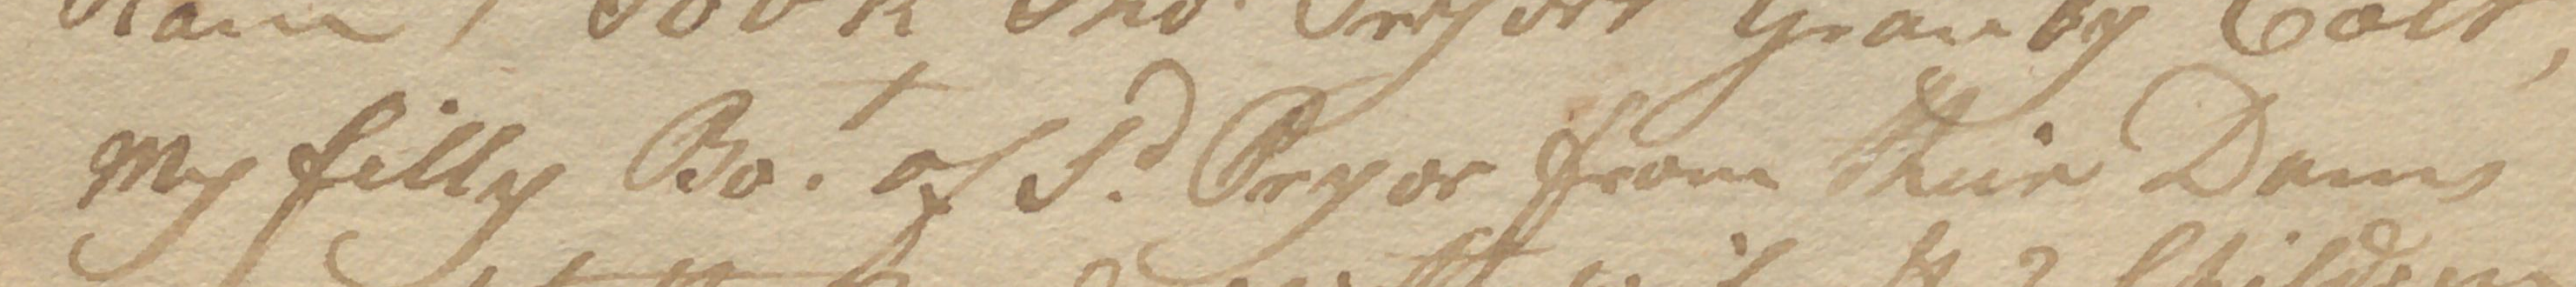My filly Bo^t. of s^d. Pryor from their Dams
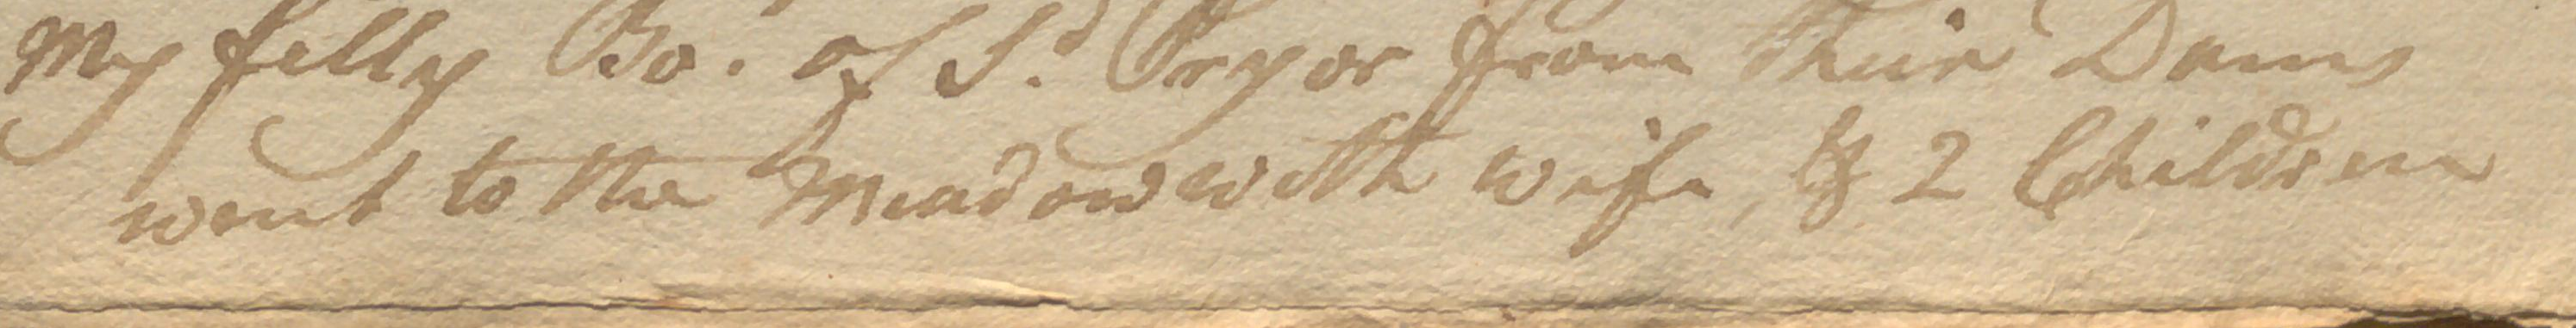went to the Meadow with wife, & 2 Children
